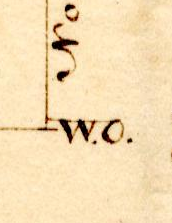W.O.
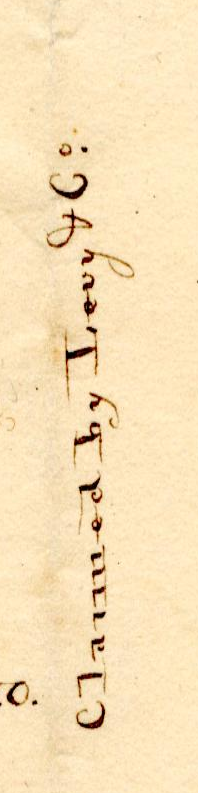Claimed by Levy & C^o.
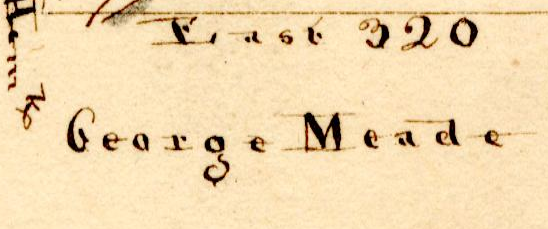George Meade
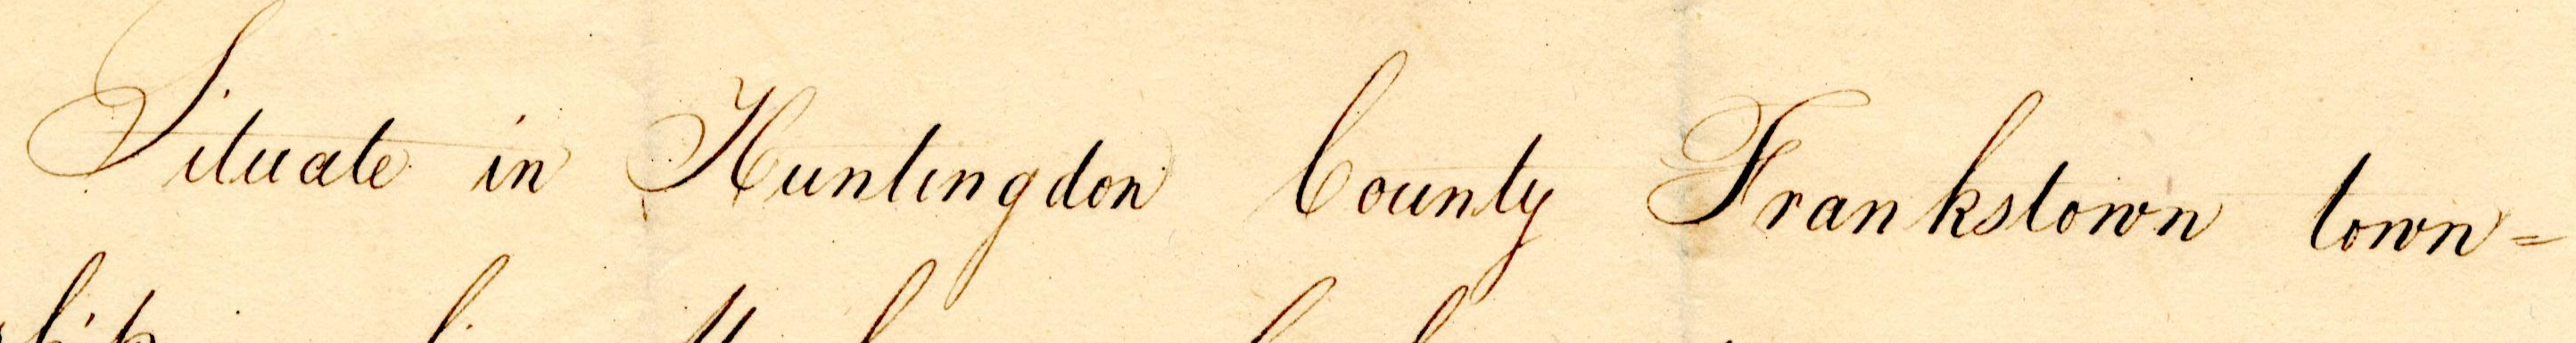Situate in Huntingdon County Frankstown town-
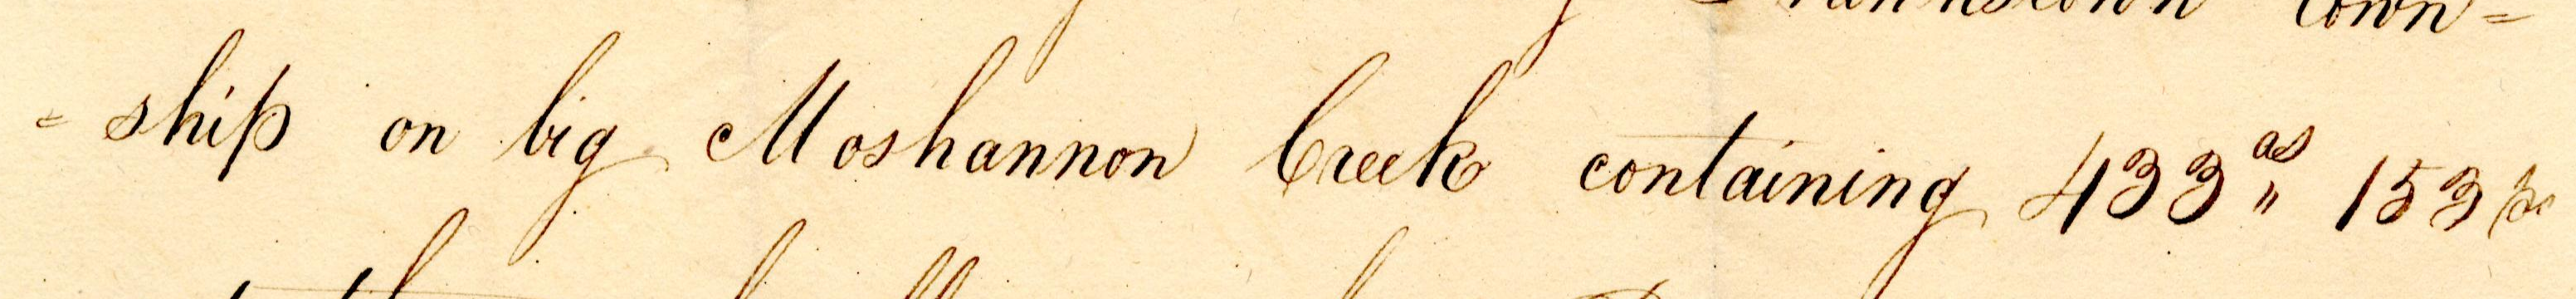-ships on big Moshannon Creek containing 433^as. 153 p
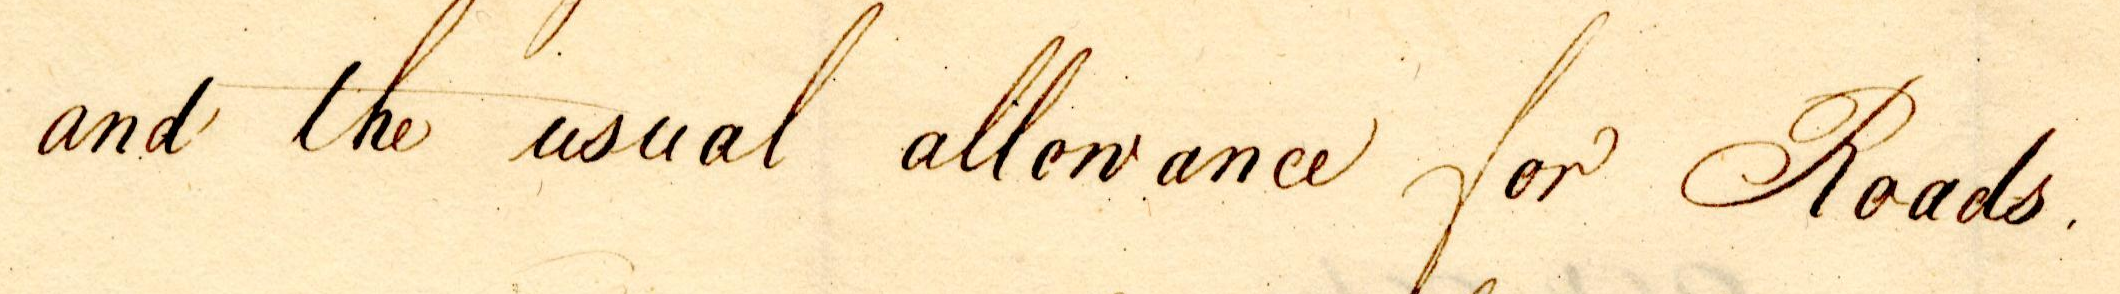and the usual allowance for Roads
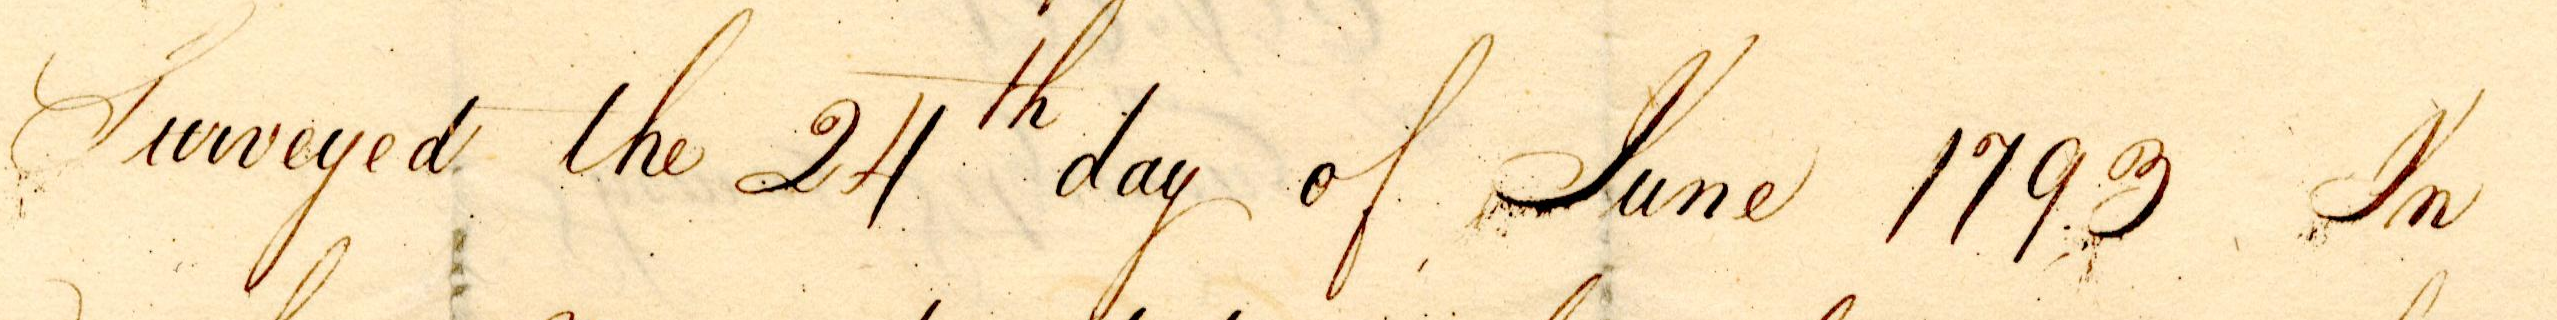Survyed the 24^th day of June 1793 In
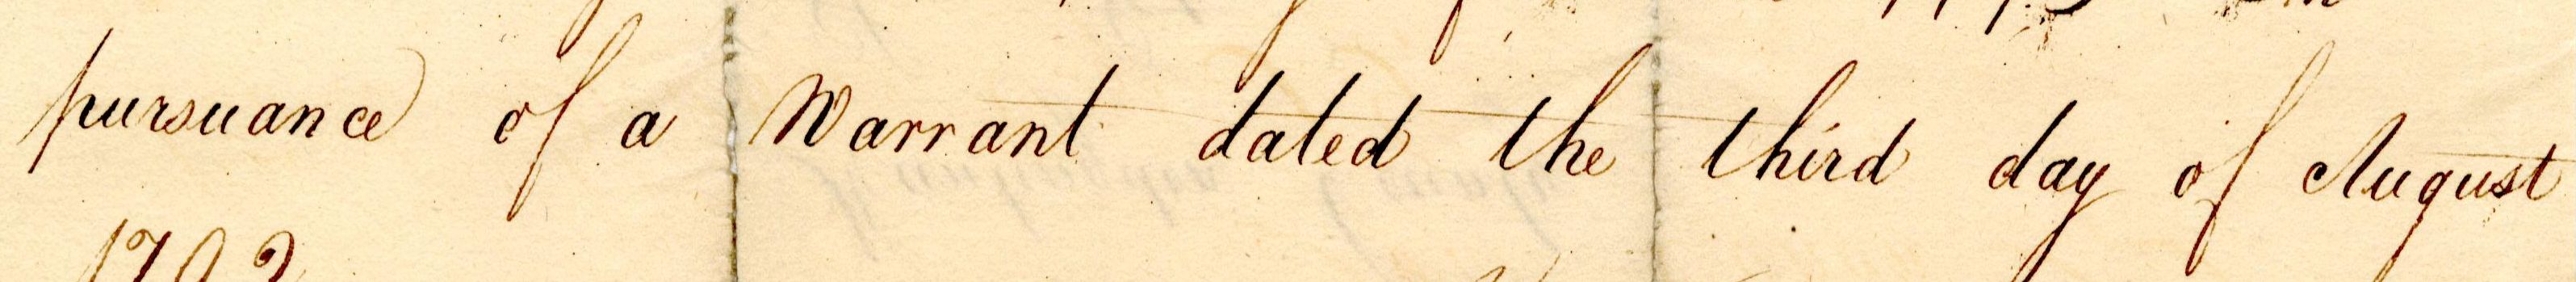pursuance of a Warrant dated the third day of August
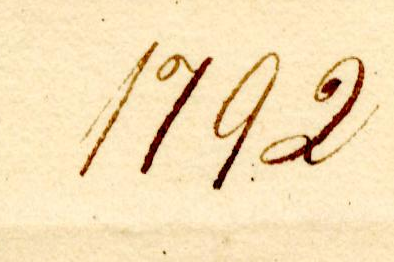1792
